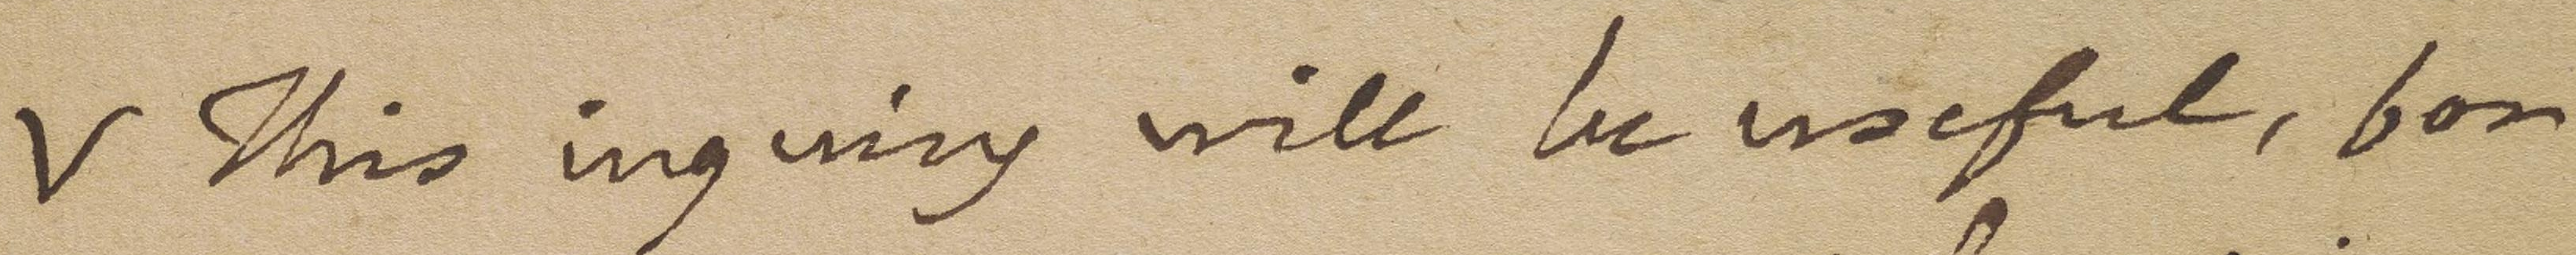V This inquiry will be useful, for
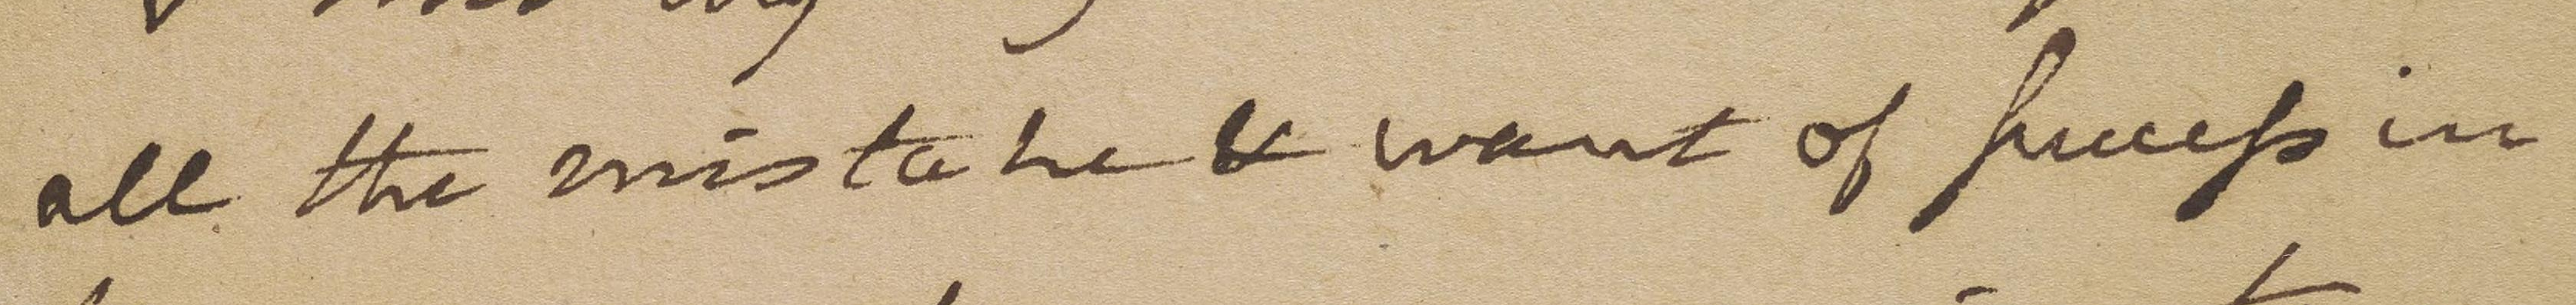all the mitstake & want of success in
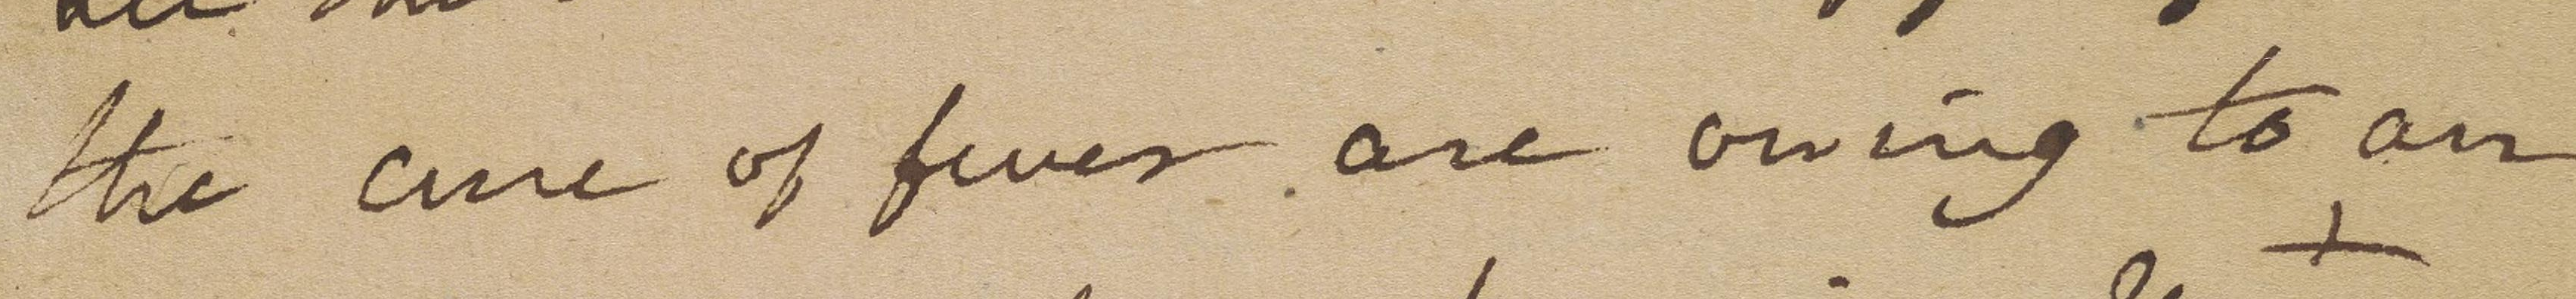the cure of fever are owing to an
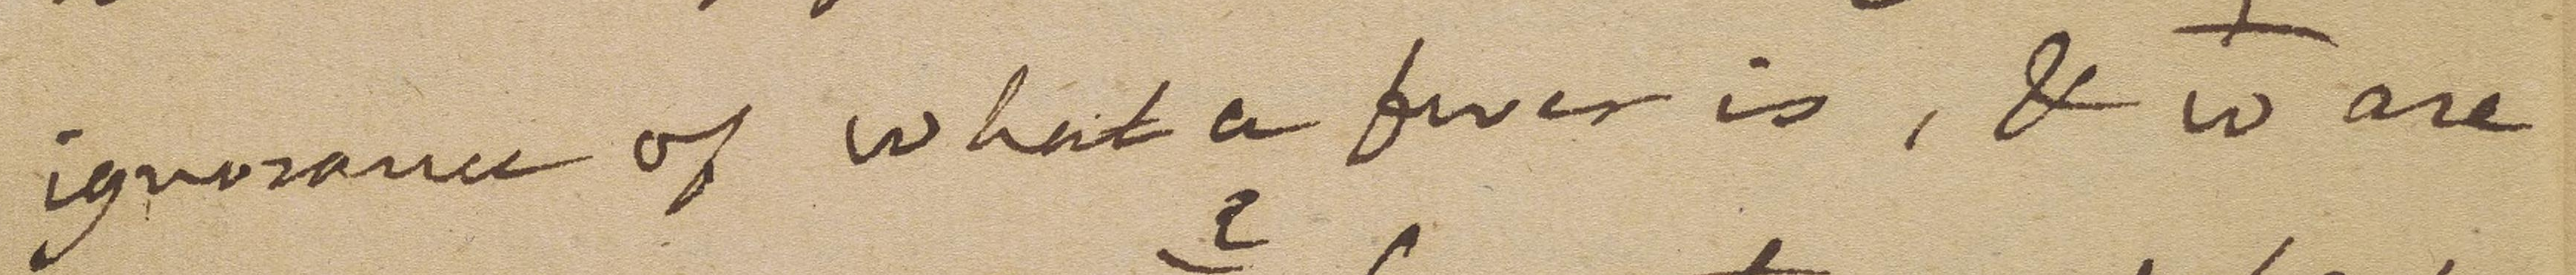ignorance of what a fever is, & w^t are
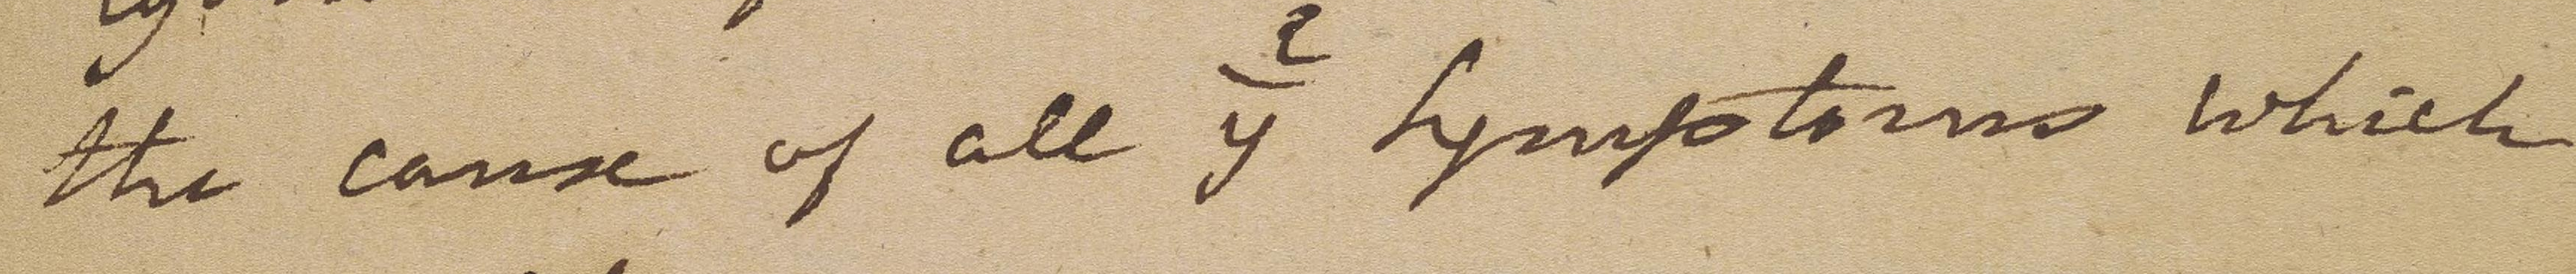the casue of all y^e symptoms which
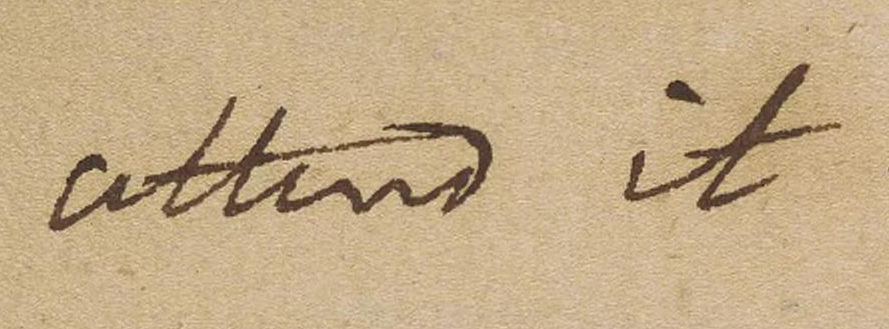attend it.
